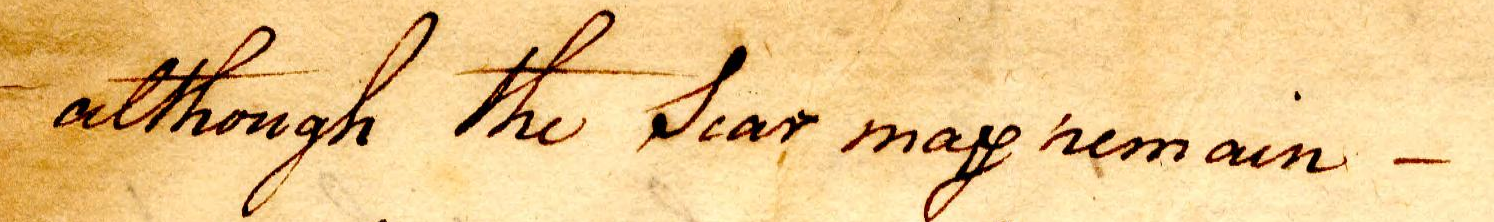although the Scar may remain.
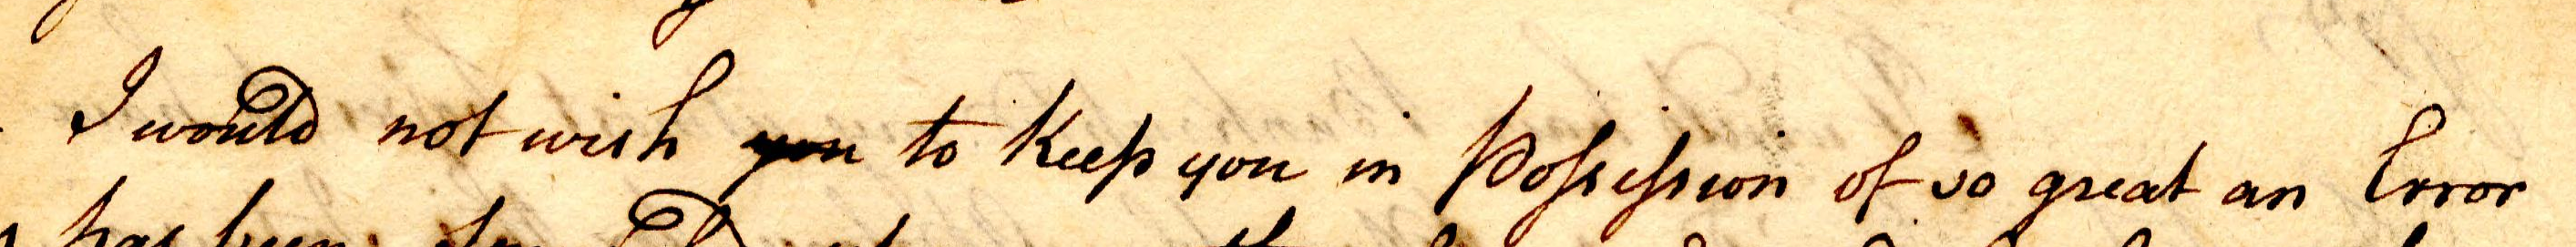I would not wish you to keep you in Possession of so great an Error
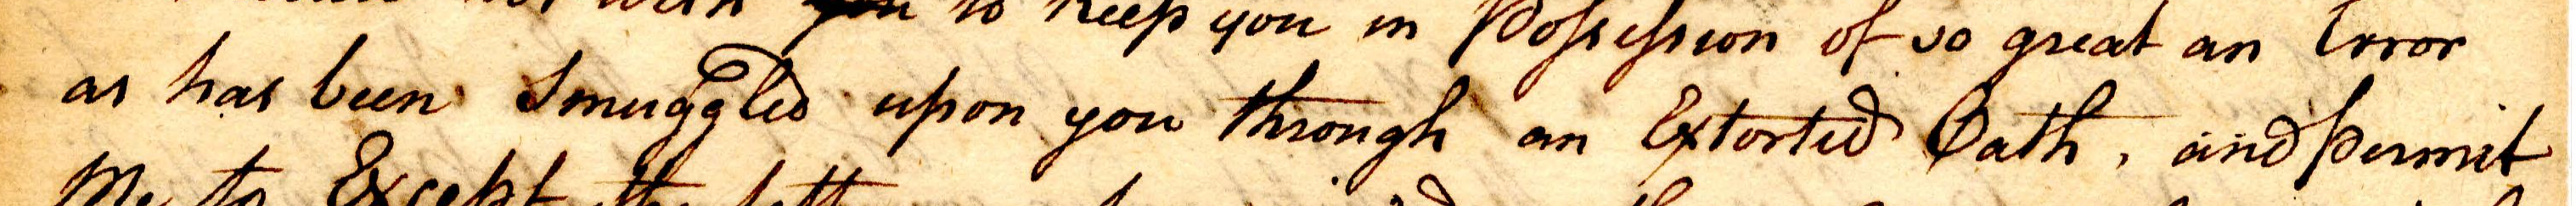as has been Smuggled upon you though an Extorted Oath, and permit
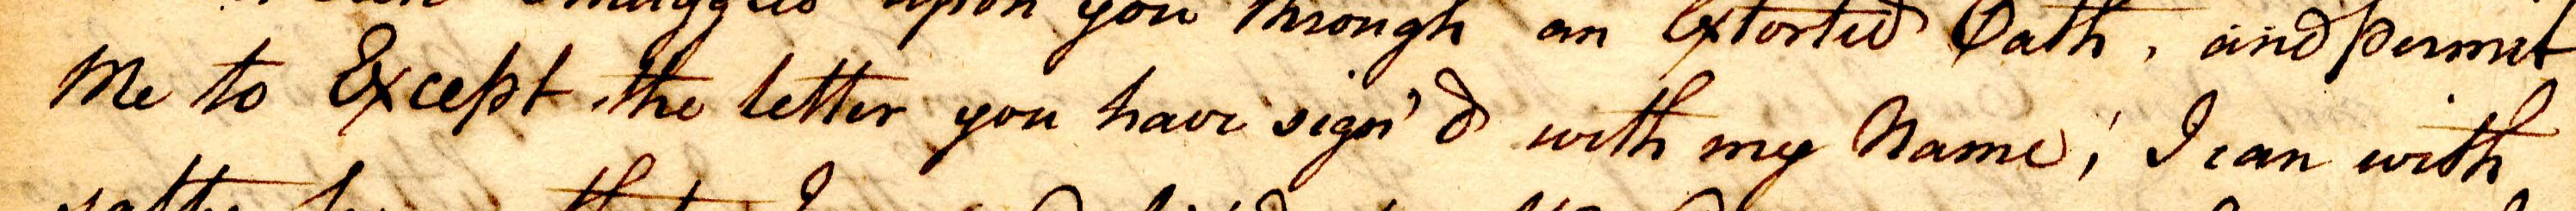Me to Except the letter you have sign'd with my Name; I can with
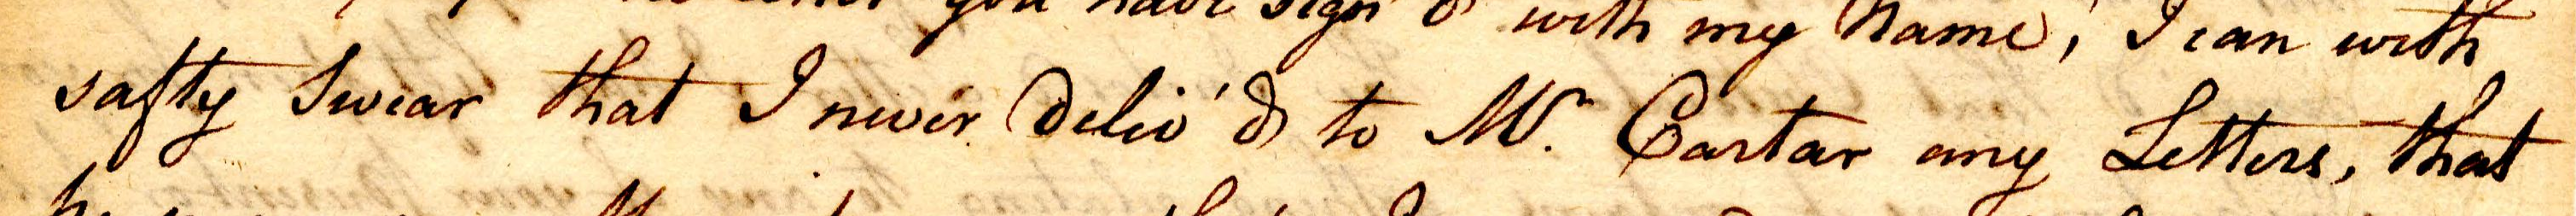safty Swear that I never deliv d to M^r. Cartar any Letters, that
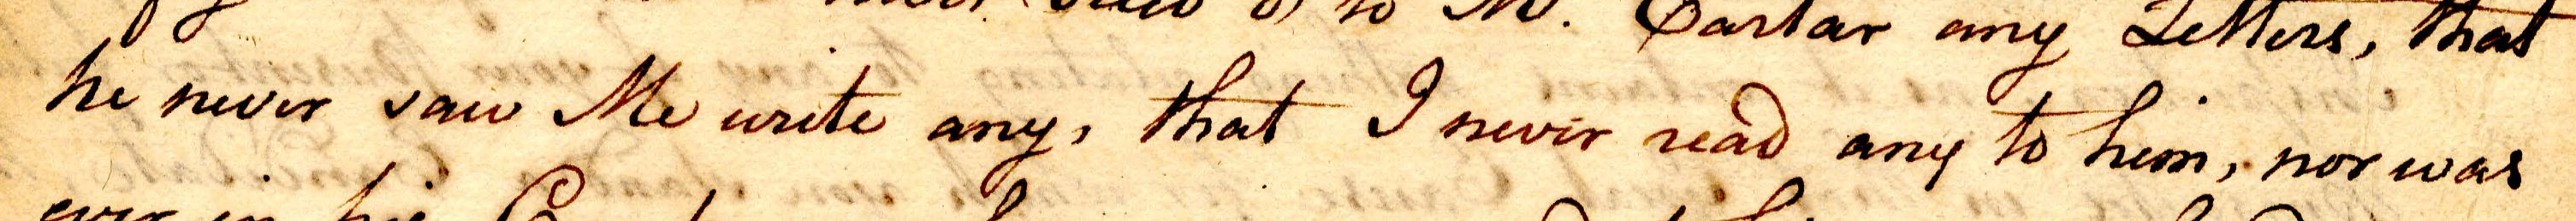he never saw Me write any, that I never read any to him, nor was
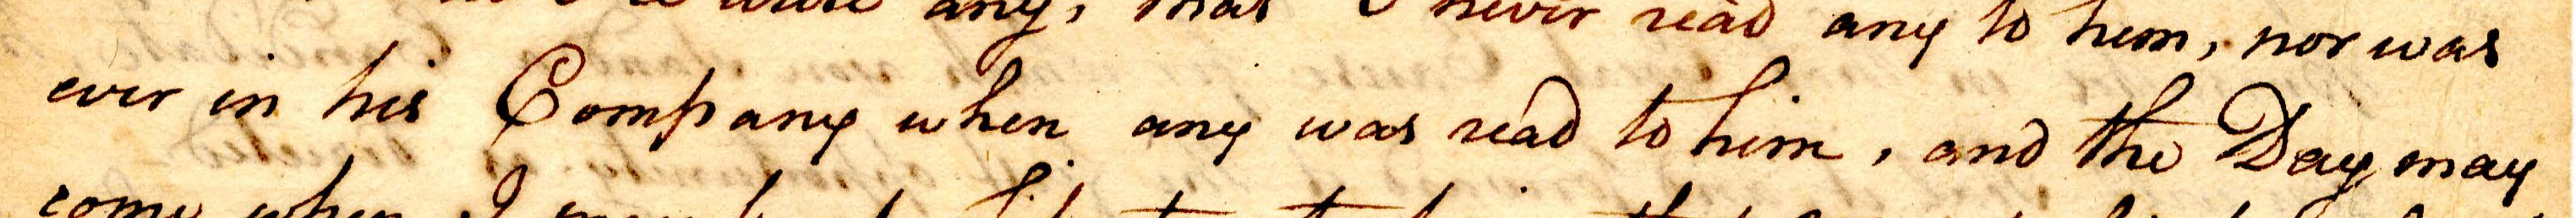ever in his Company when any was read to him, and the Day may
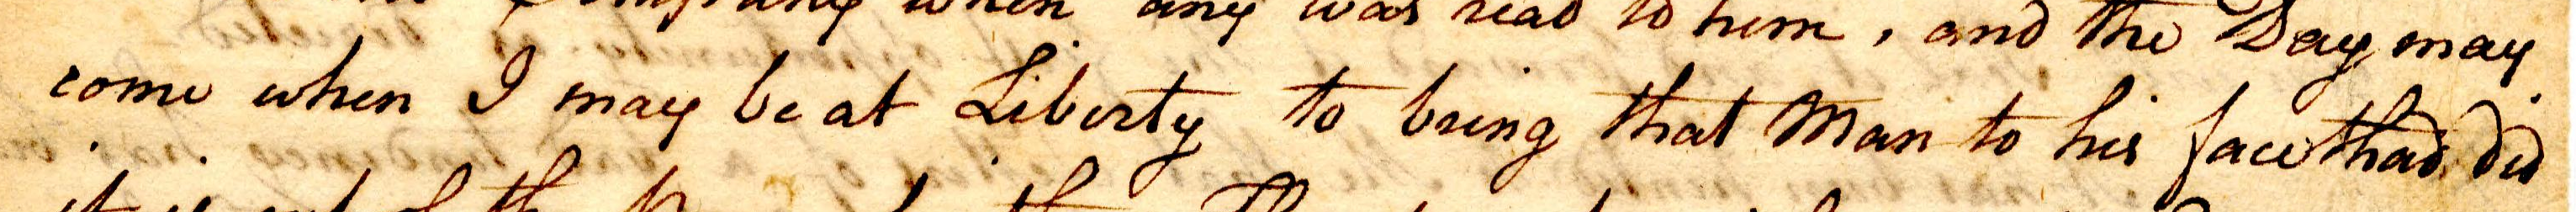come when I may be at Liberty to being that Man to his face & had did
